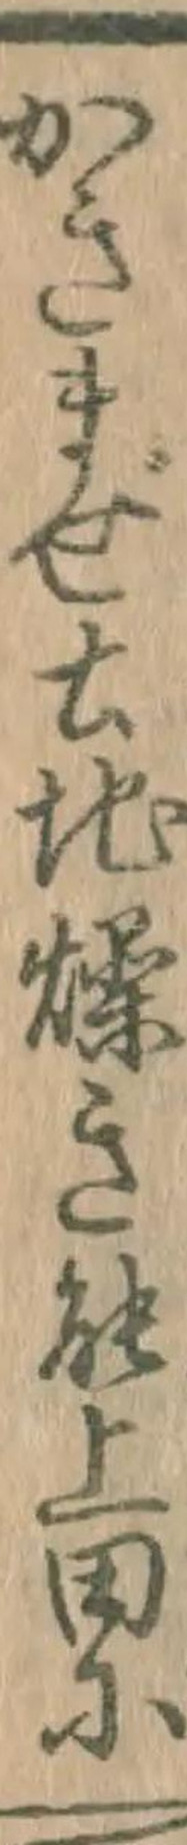かきまぜ土地燥き能上田に
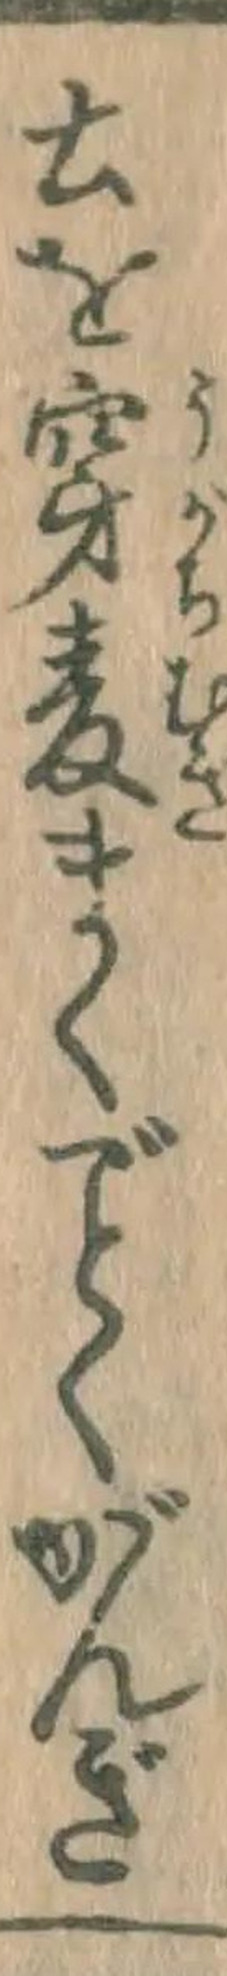土を穿麦まくごとくがんぎ
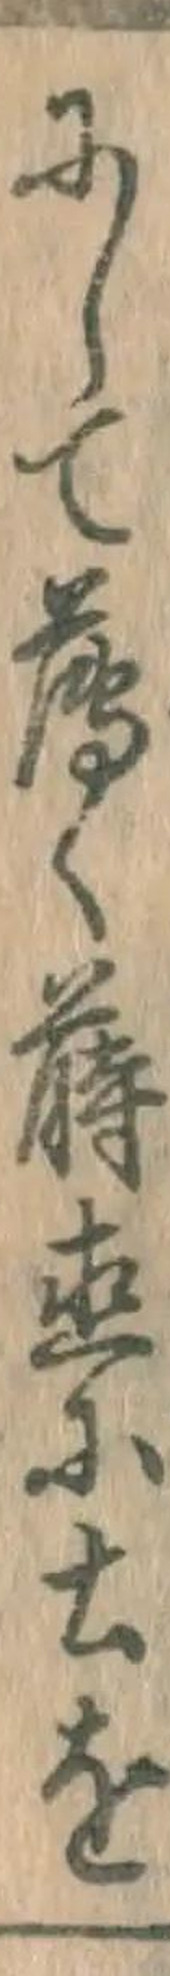にして薄く蒔直に土を
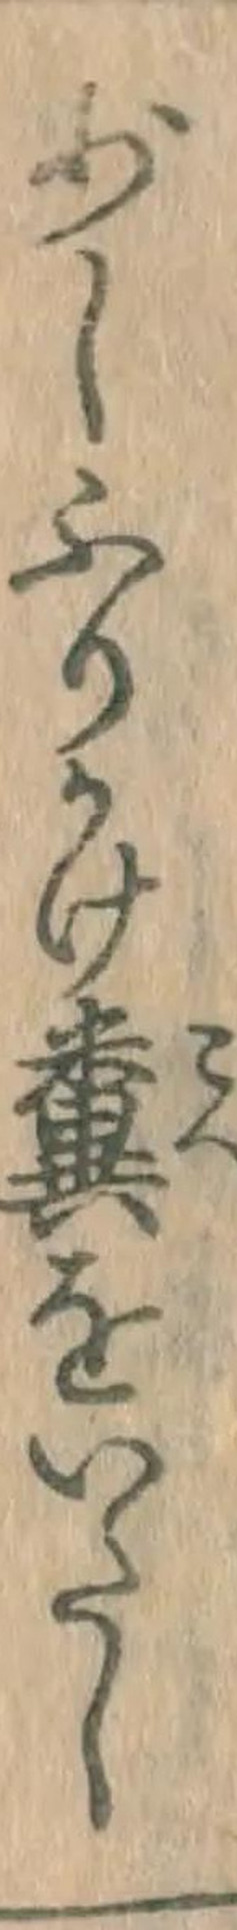少しふりかけ糞をいたし
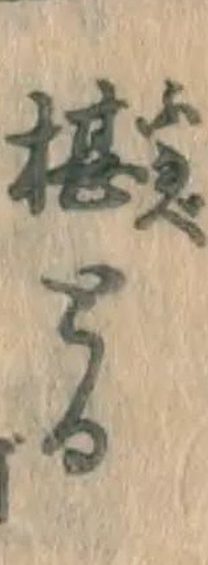椹とる
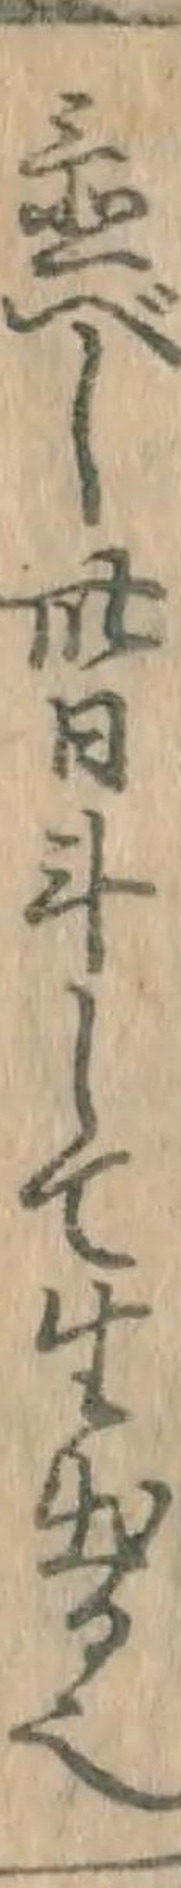置べし卅日斗して生出る也

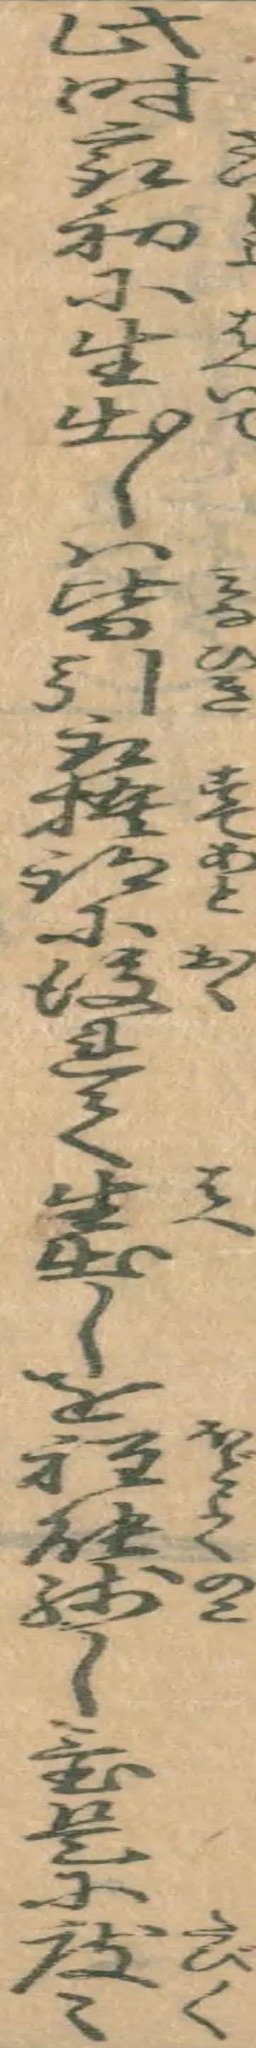此時最初に生出しは皆引取捨跡に後れて生出しを程能残し置是に度々
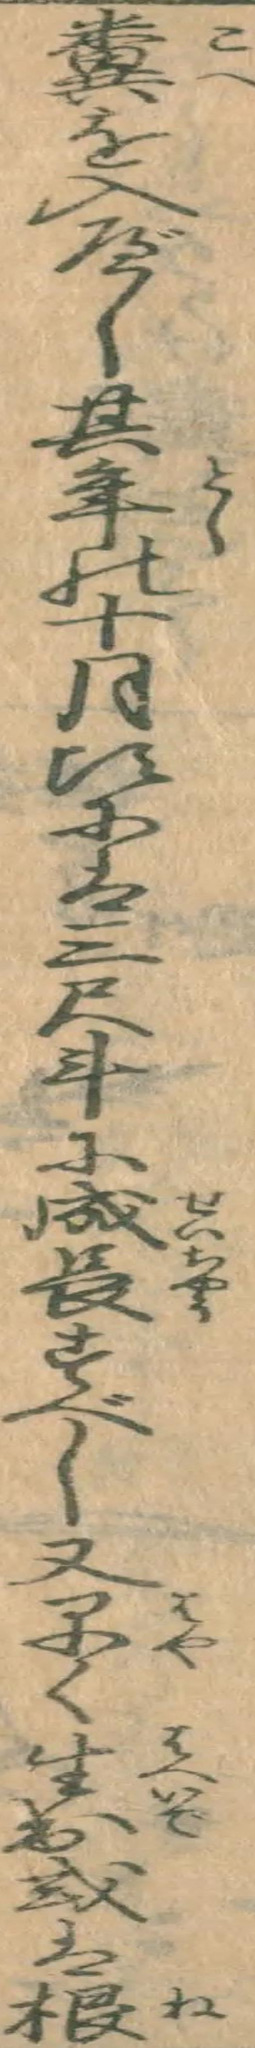糞を入べし其年の十月頃には三尺斗に成長すべし又早く生出或は根
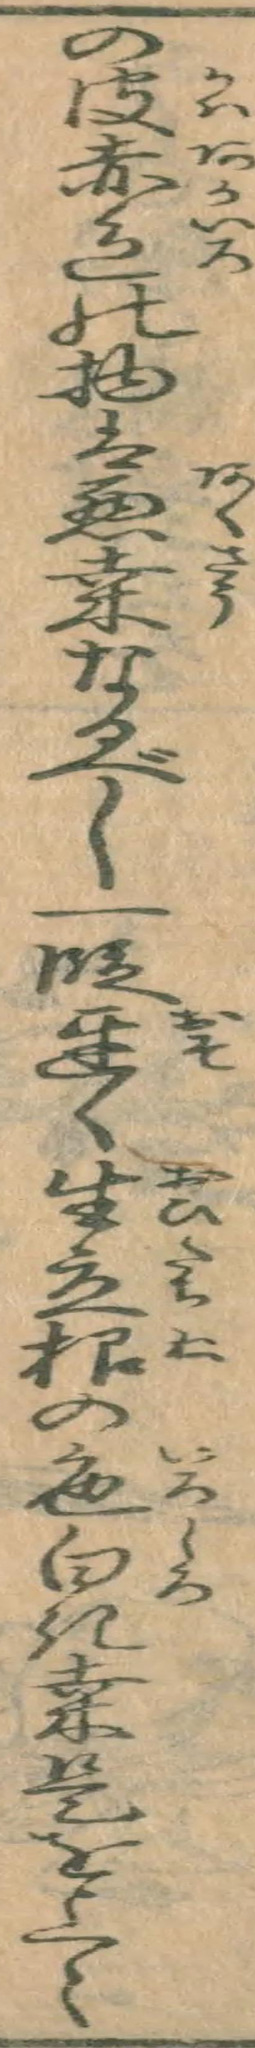の皮赤色の物は悪桑なるべし一段遅く生立根の色白き桑是を上々
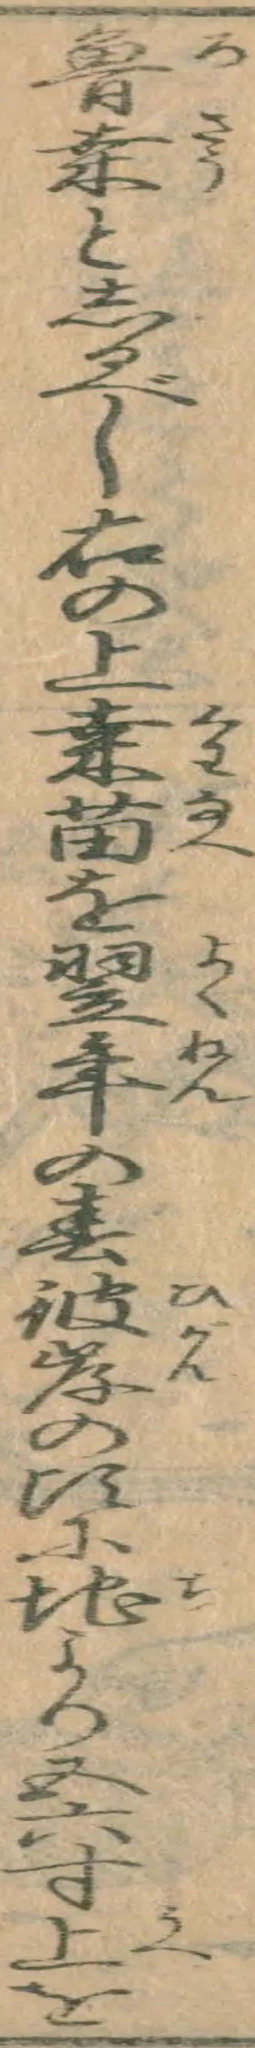魯桑としるべし右の上桑苗を翌年の春彼岸の頃に地より五六寸上を
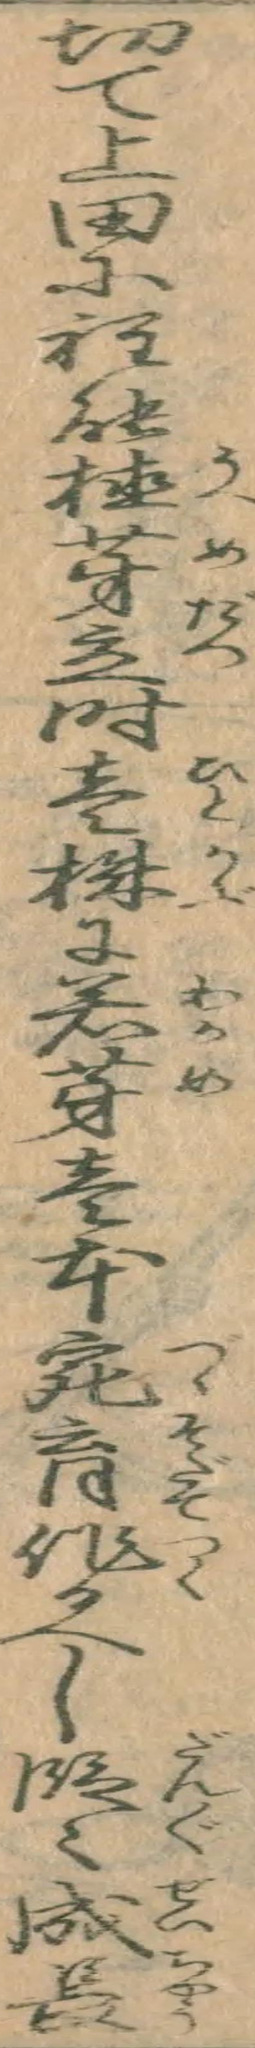切て上田に程能植芽立時壱株に若芽壱本宛育作るへし段々成長
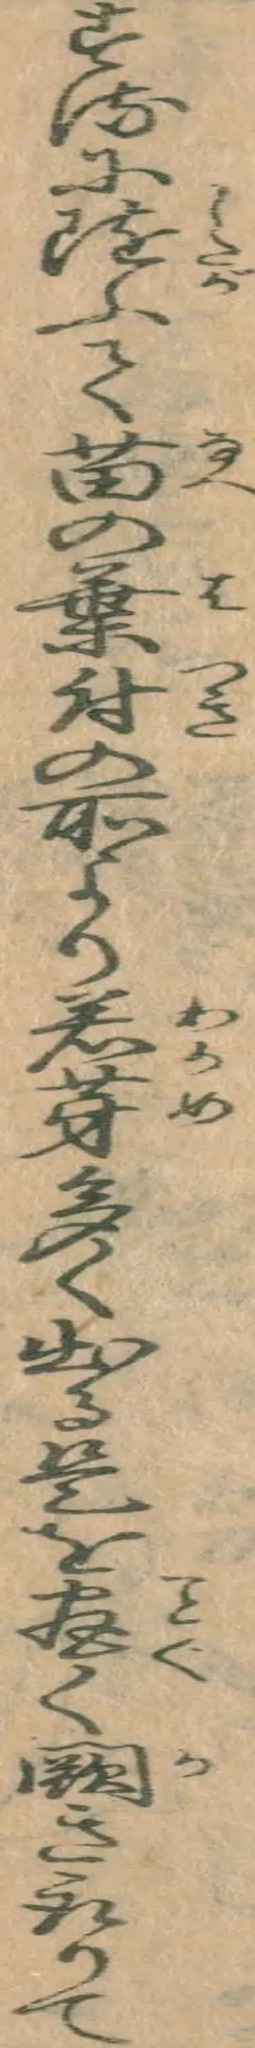するに随ふて苗の葉付の所より若芽多く出る是を盡く闕き取りて
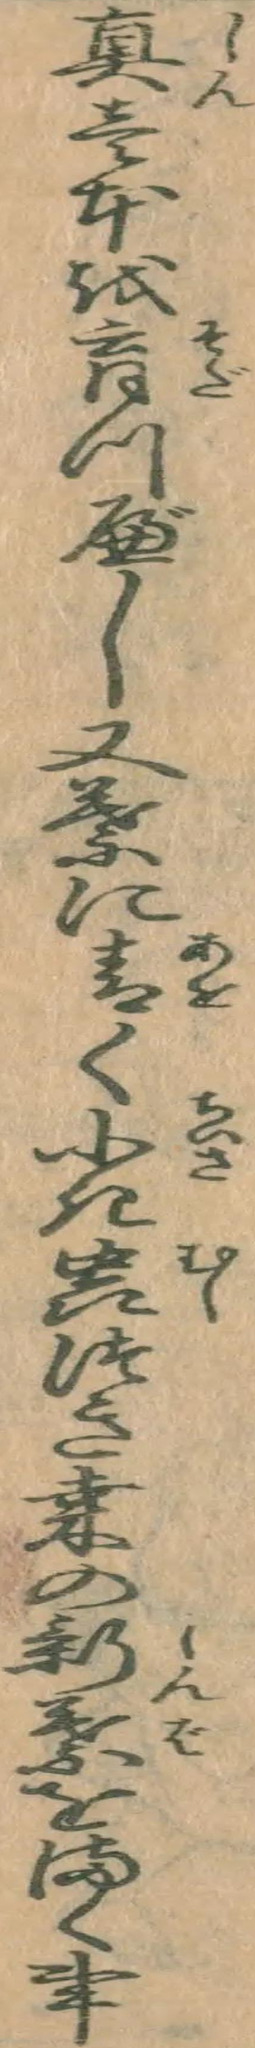真壱本を育つべし又葉に青く小き虫つき桑の新葉をまく事
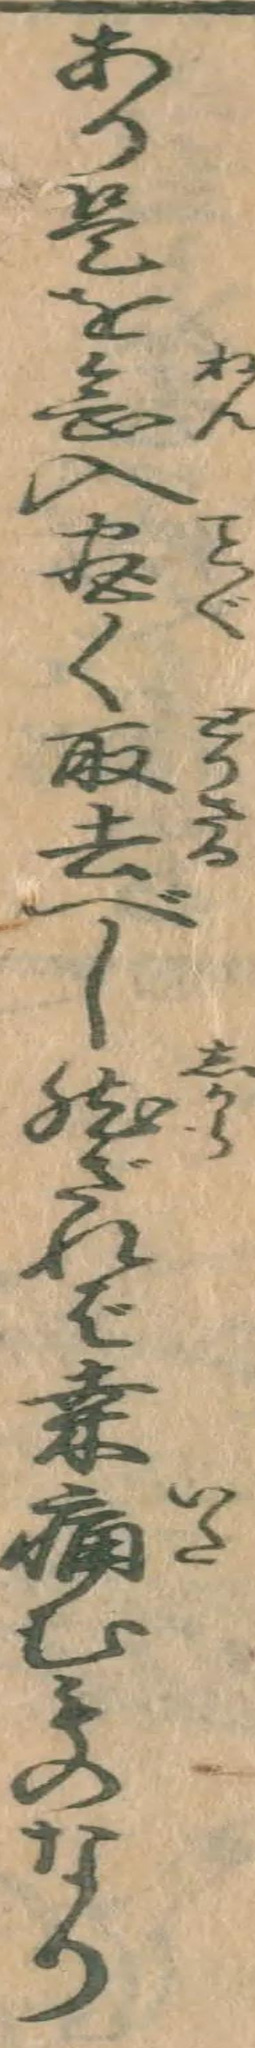あり是を念入盡く取去べし然ざれば桑痛むものなり
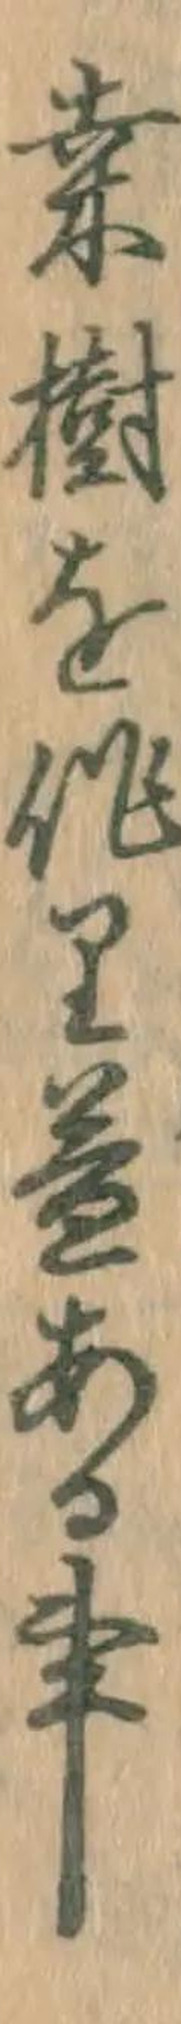桑樹を作り益ある事
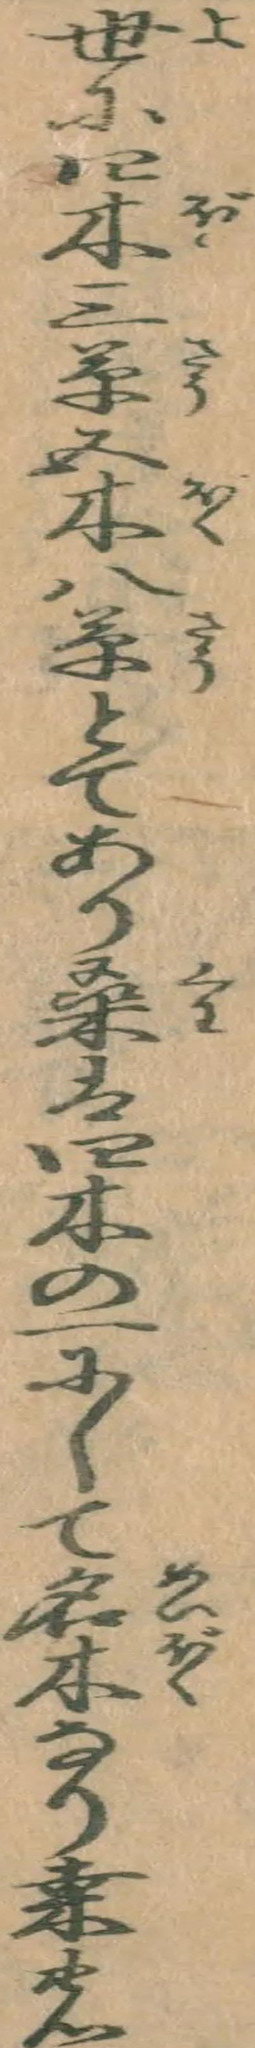世に四木三草五木八草とてあり桑は四木の一にして名木なり桑の
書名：養蚕秘録 3巻. [1]
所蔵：国立国会図書館 National Diet Library, JAPAN
